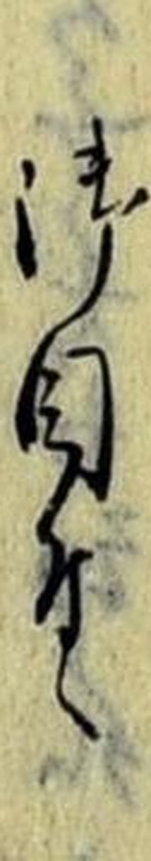御目付へ
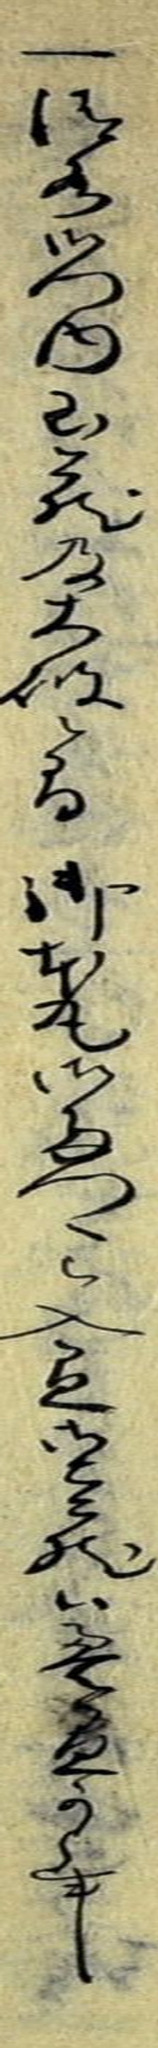一清水御門内玉蔵及大破候間御本丸御多門へ被入置御土蔵は畳置可申事
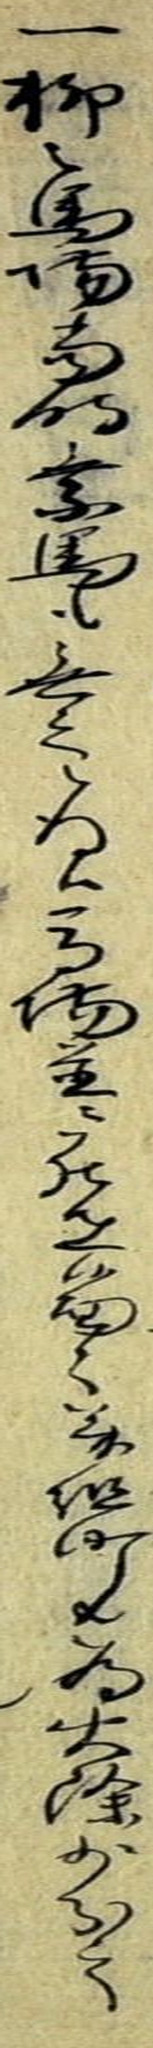一柳之馬場当時乗馬も無之候得は馬場並に罷在候面々并組町共為火除少分之
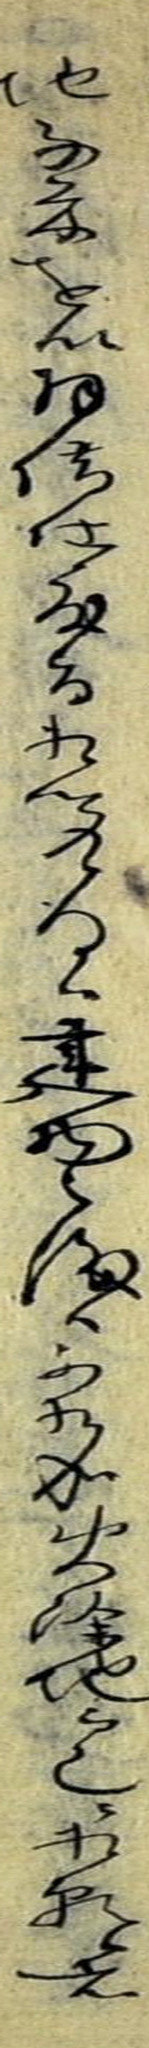地子米を以拝借仕度旨相聞候得は建物之儀は不相成火除而己に相願候者
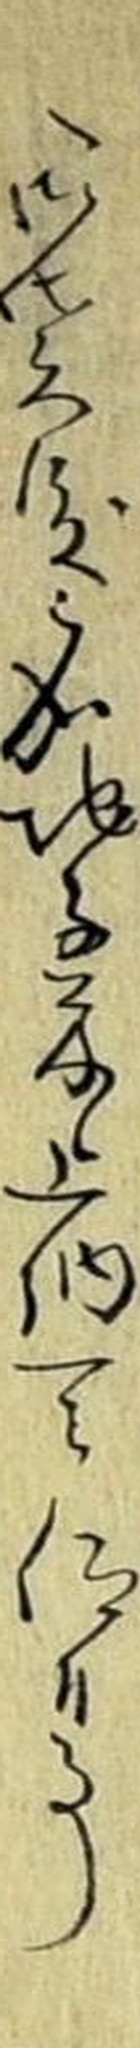へ御貸渡被成地子米上納可被仰付事
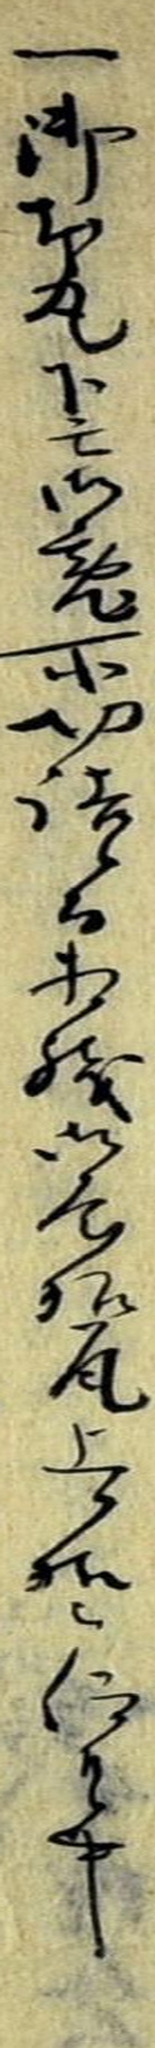一御本丸下モ御台所切詰候而相残候御屋根瓦上候様被仰出候事
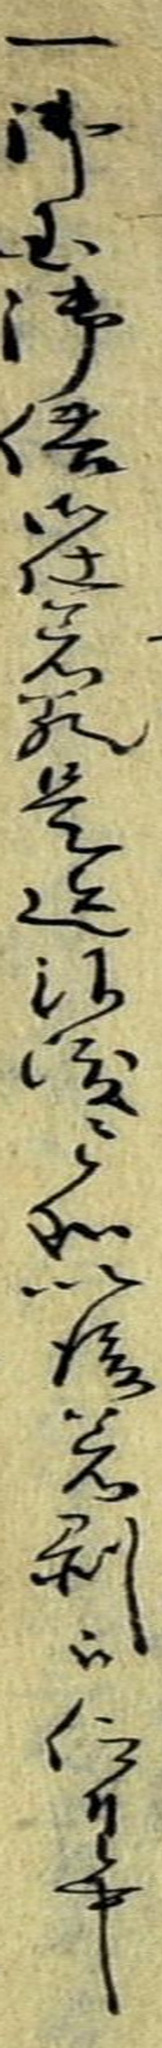一御国御借御仕着類是迄銀渡に候処以後着剥被仰付候事
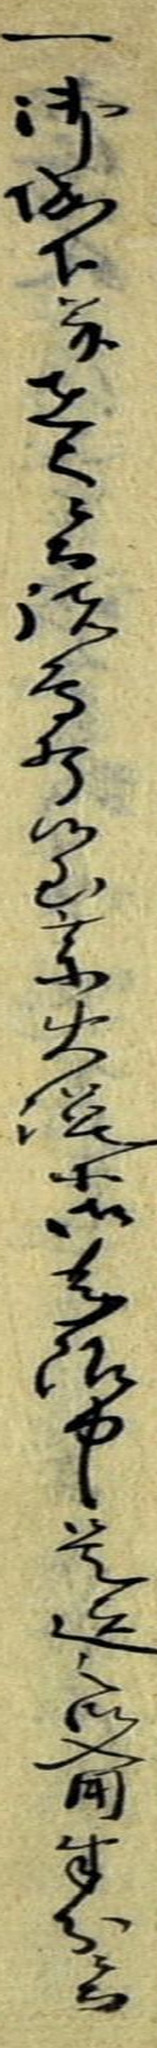一御城下并在々に而諸鳥打候玉薬火縄等御年限中是迄之御入用半分に而

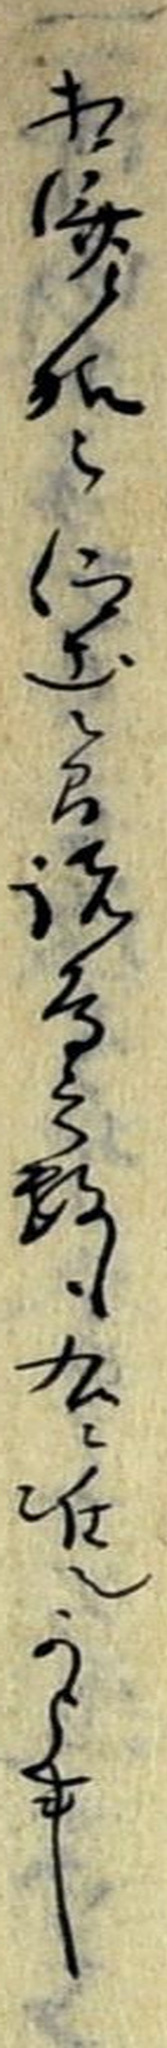相済候様被仰出候間諸鳥之数も右に准し可申事
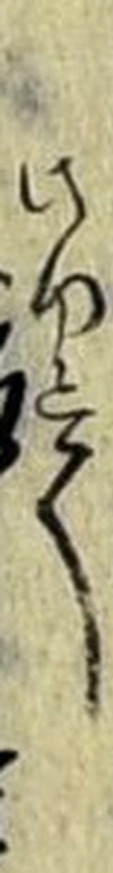此内壱人
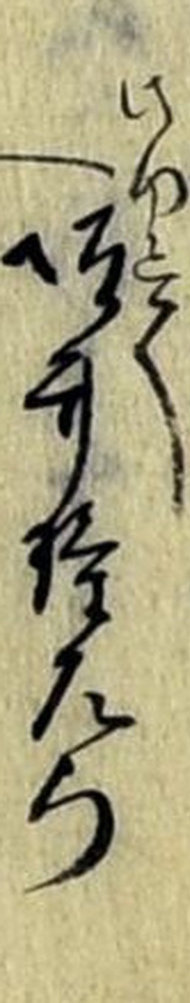坂井権左衛門
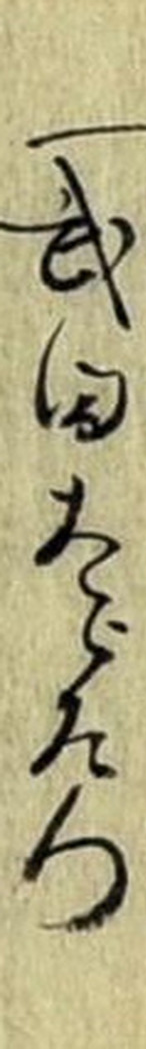武田太郎左衛門
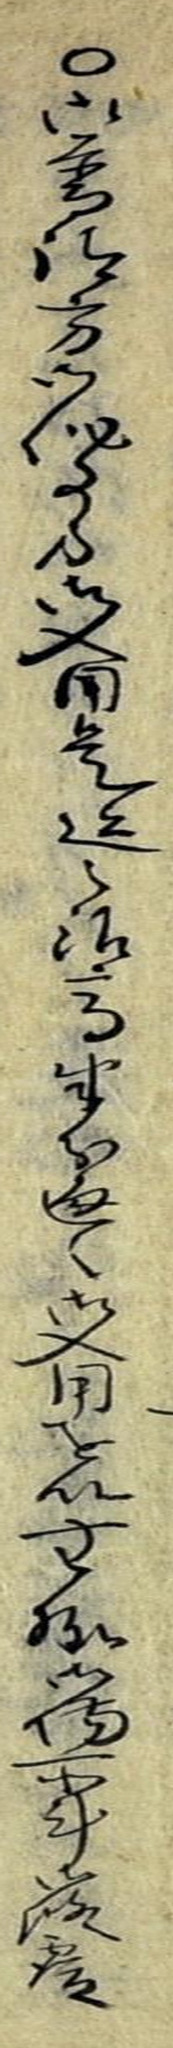○御普請方御作事方御入用是迄之銀高半分通之御入用を以無拠御場所斗御修覆
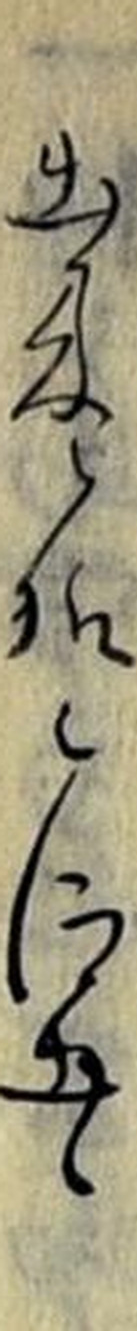出来候様被仰出候
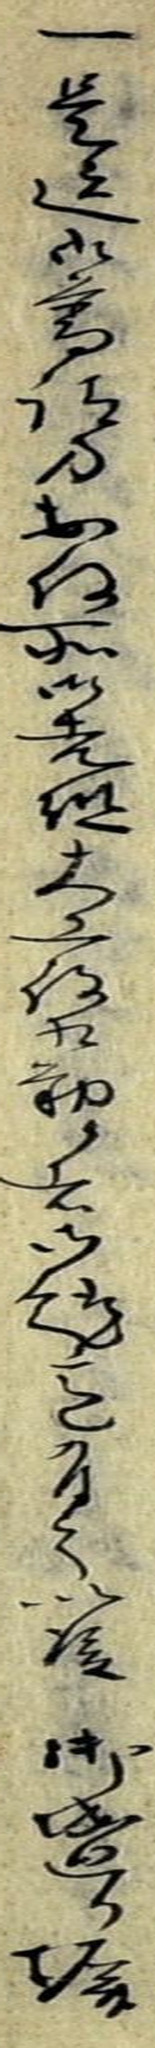一是迄御普請方於役所御先組大工役相勤候者御趣意有之以後御城廻り塀
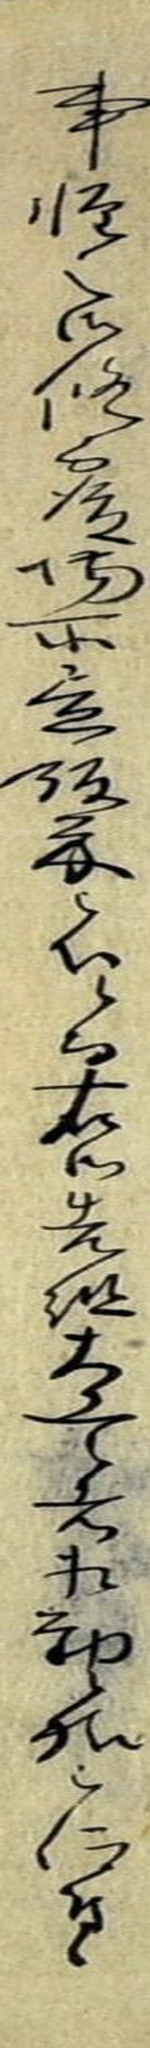事軽之御修覆場所昼飯米被下候而右御先組大工役之者相勤候様被仰付候
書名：命令之部 四
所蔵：福井県文書館 Fukui Prefectural Archives
